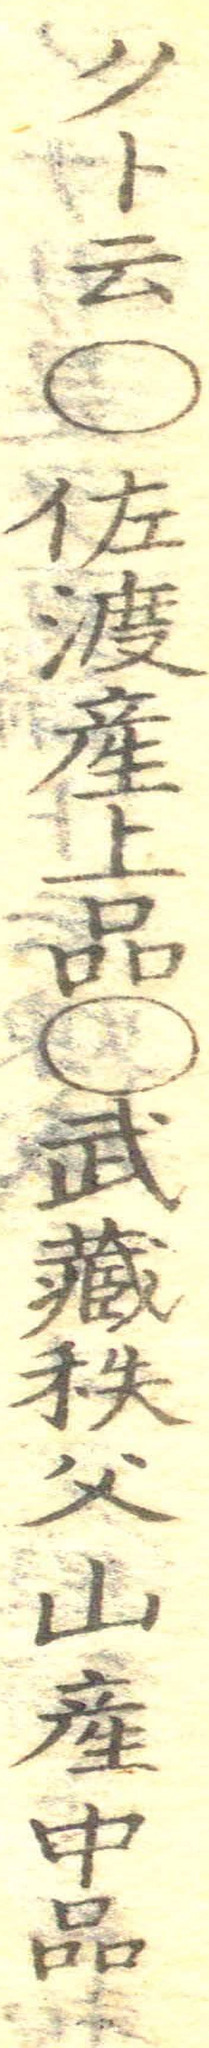クト云○佐渡産上品○武蔵秩父山産中品
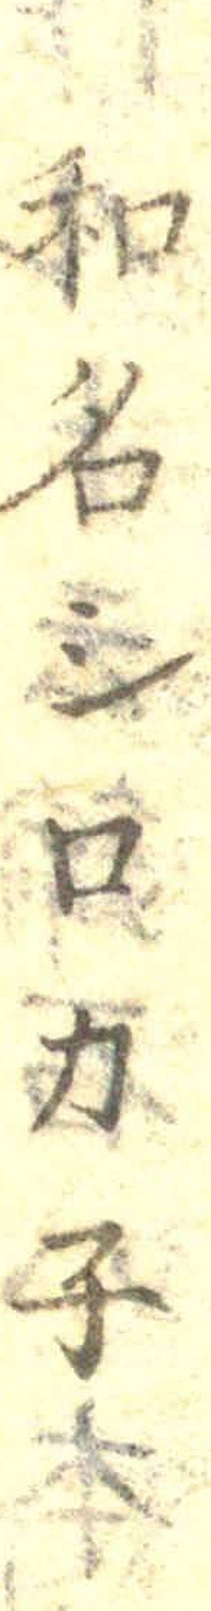銀和名シロカネ
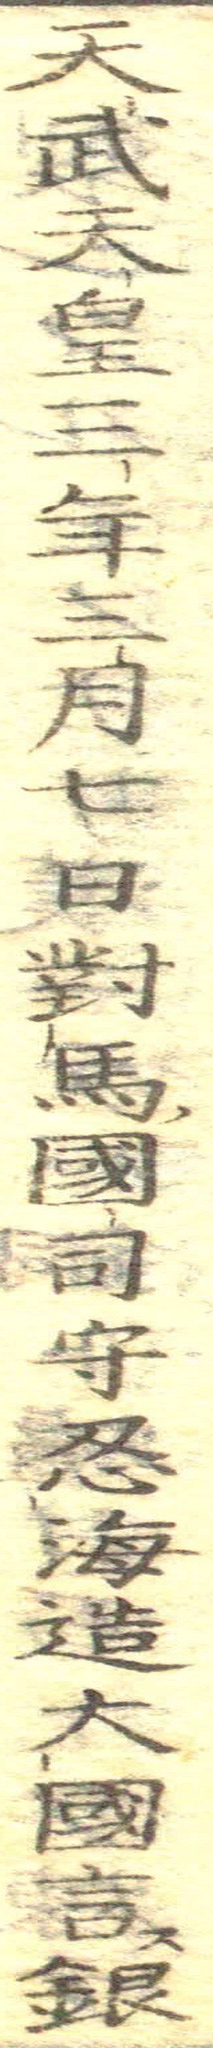天武天皇三-年三月七日対-馬国国-司守忍海造大国-言銀
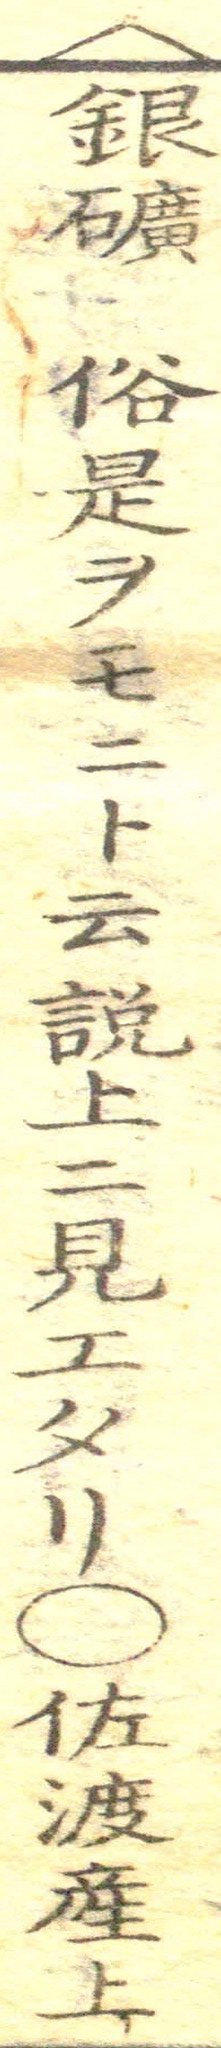△銀礦俗是ヲモニト云説上ニ見エタリ○佐渡産上-

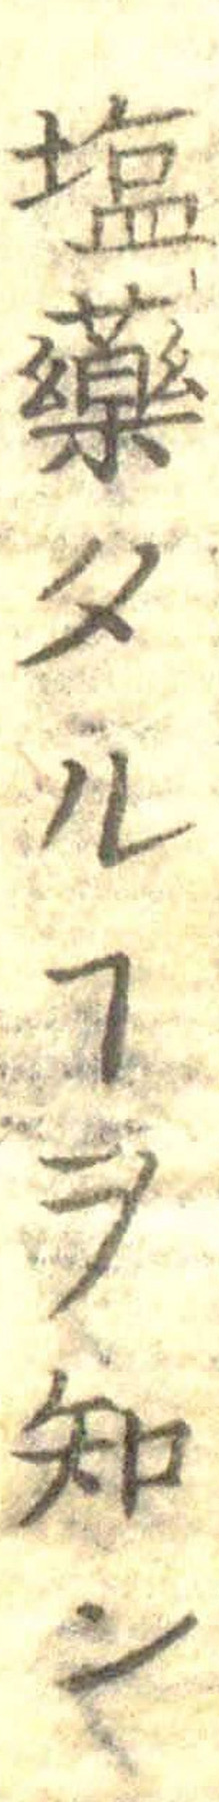塩薬タルコトヲ知ン
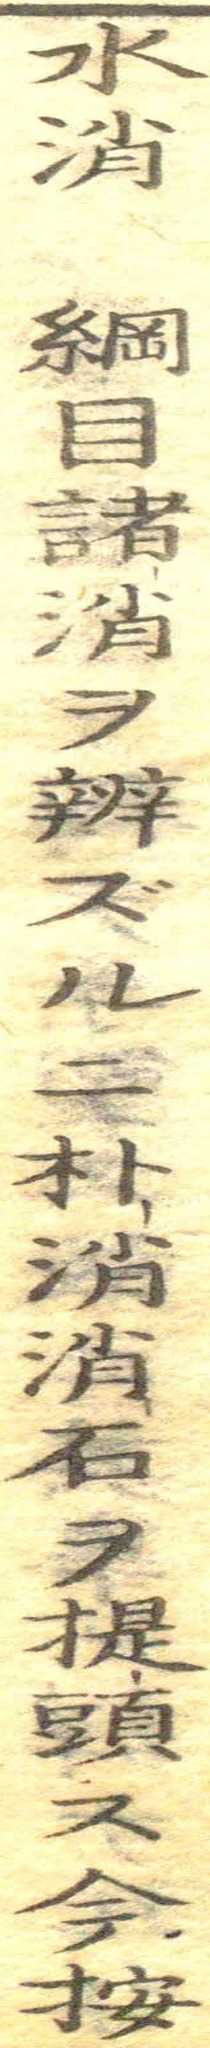水消綱目諸消ヲ弁ズルニ朴-消石ヲ提-頭ス今按
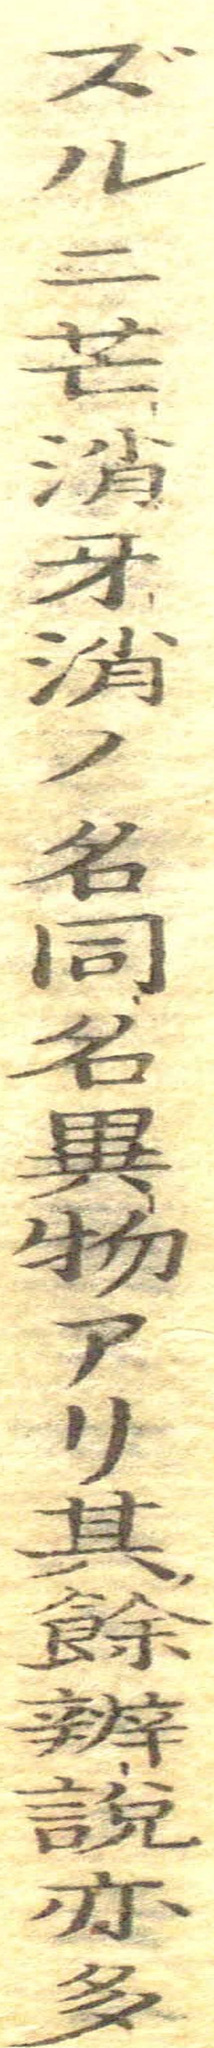ズルニ芒苦消牙消ノ名同名異物アリ其余弁説亦多
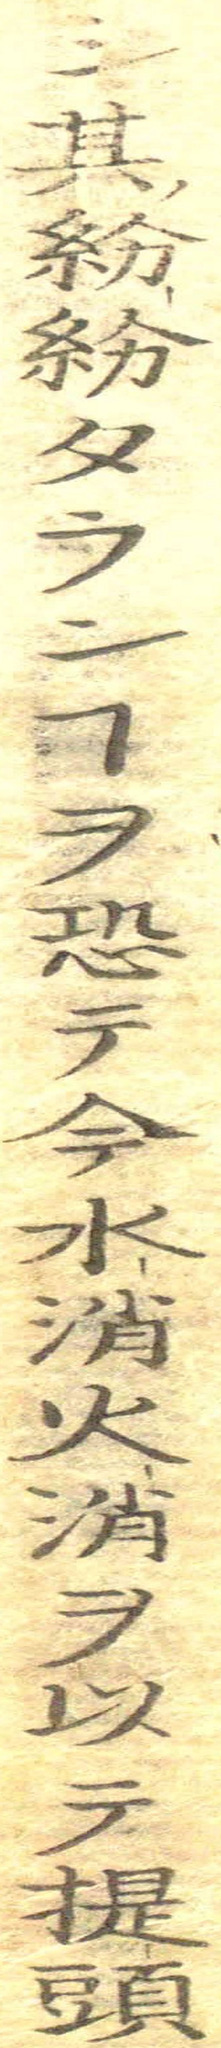シ其紛-紛タランコトヲ恐テ今水-消火-消ヲ以テ提頭
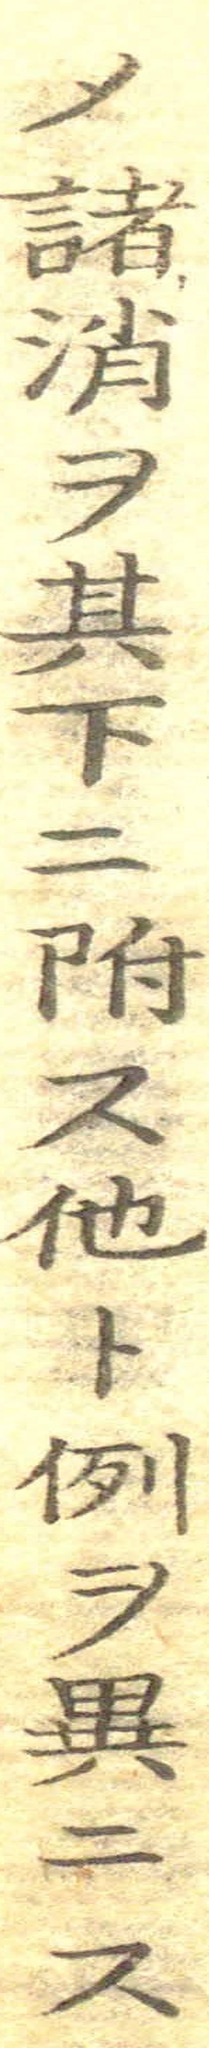シテ諸消ヲ其下ニ附ス他ト例ヲ異ニス
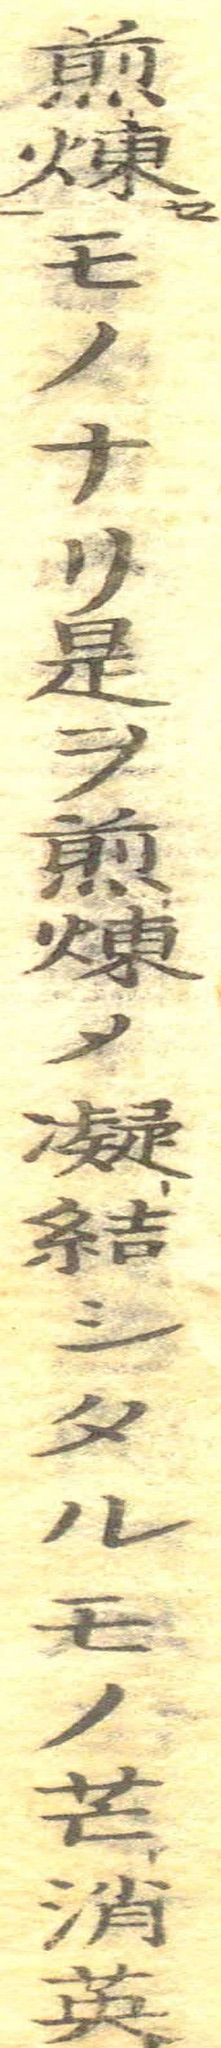煎煉是ヲ煎-煉シテ凝-結シタルモノ芒-消英
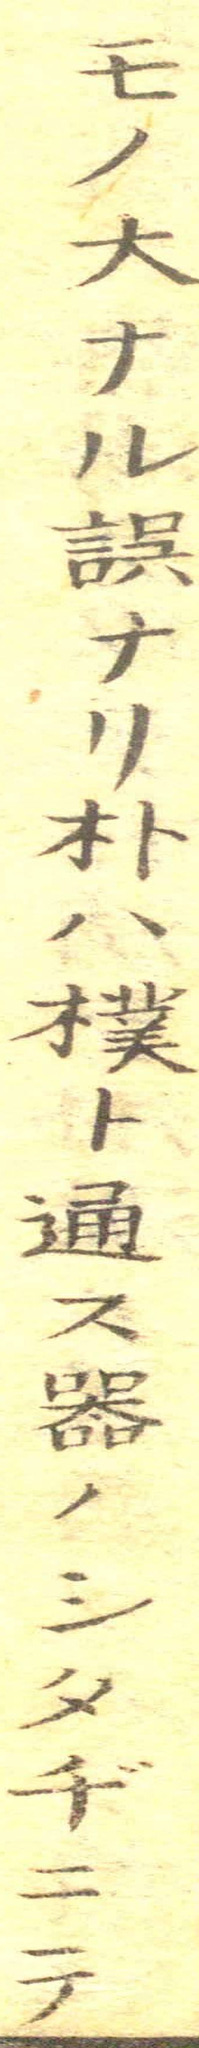モノ大ナル誤ナリ朴ハ撲ト通ス器ノシタヂニテ
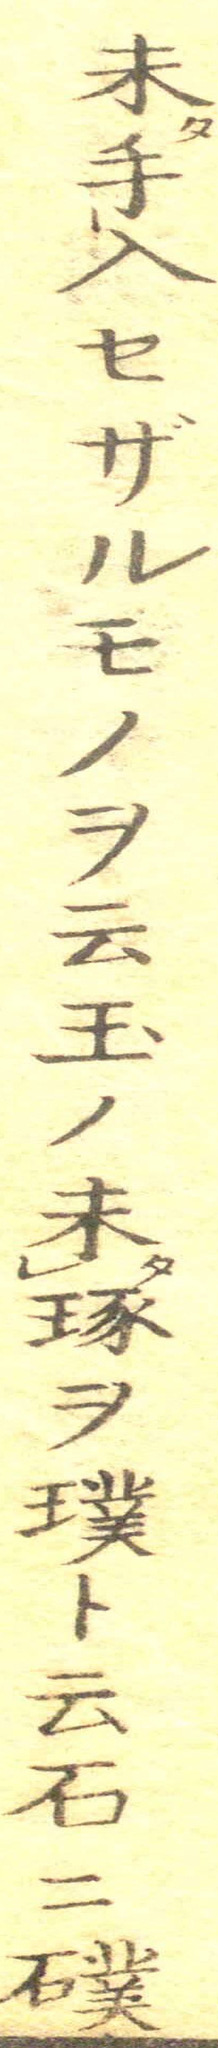末手-入セザルモノヲ云玉ノ未琢ヲ-璞ト云石ニ
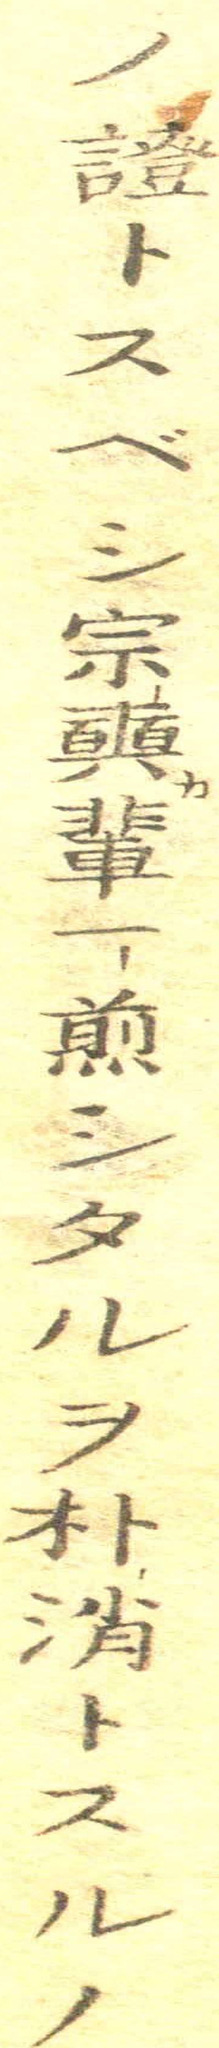ノ証トスベシ宗-奭輩一-煎シタルヲ朴-消トスルノ
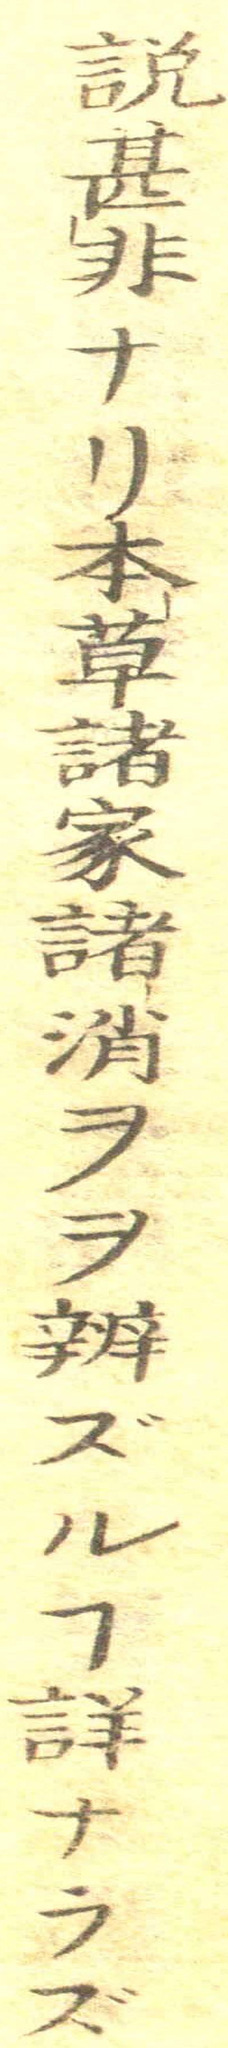説甚-非ナリ本-草諸家諸-消ヲヲ弁ずルコト詳ナラズ
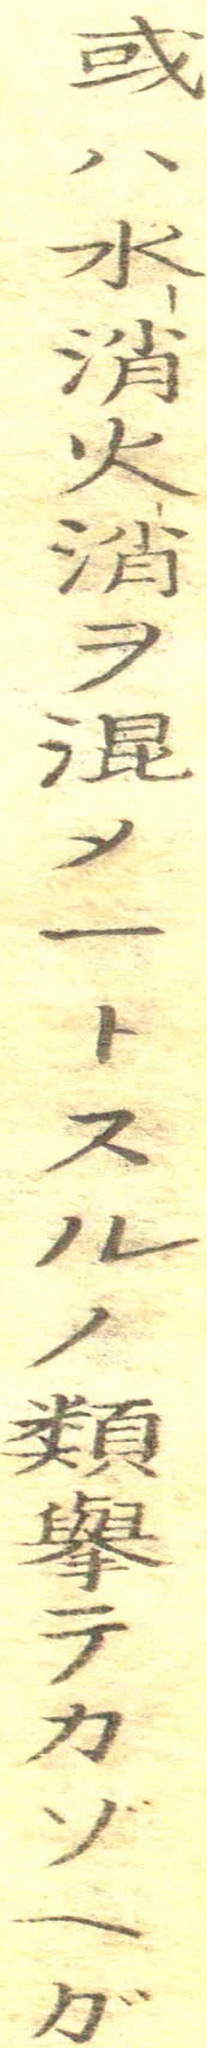或ハ水-消火-消ヲ混シテ一トスルノ類挙テカゾヘガ

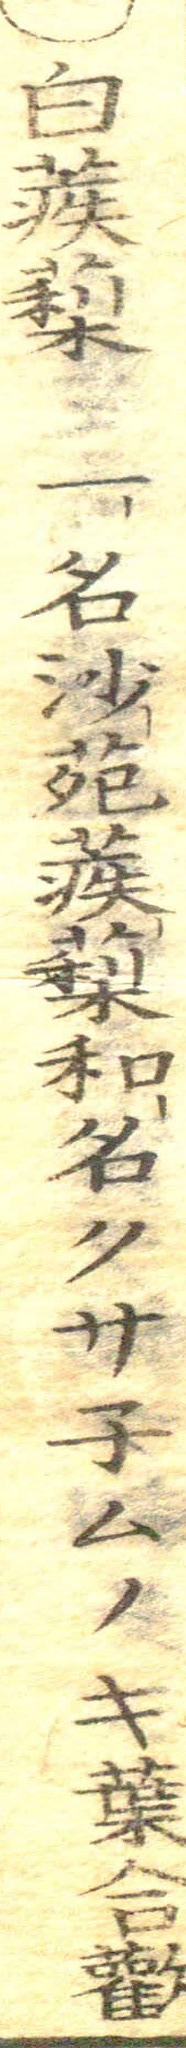○白蒺䔧一-名沙-苑蒺-䔧和-名クサネムノキ葉合歓
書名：物類品隲
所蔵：国文学研究資料館
